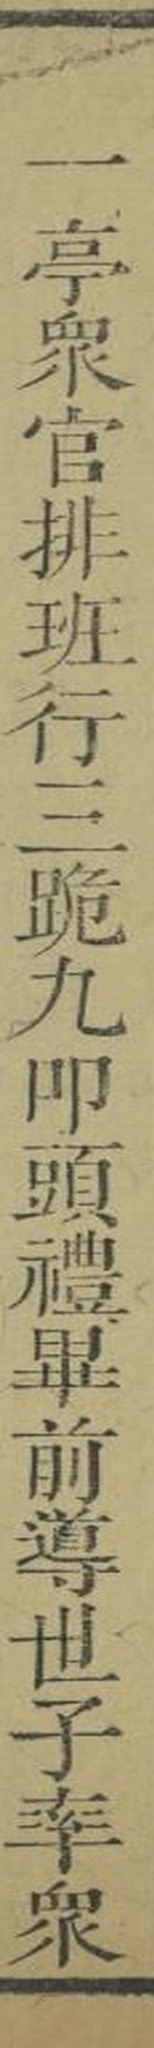一亭衆官排班行三跪九叩頭禮畢前導世子率衆
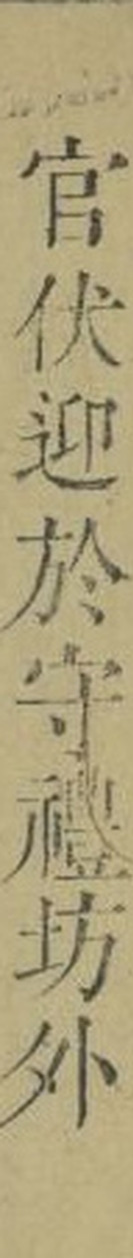官伏迎於守禮坊外
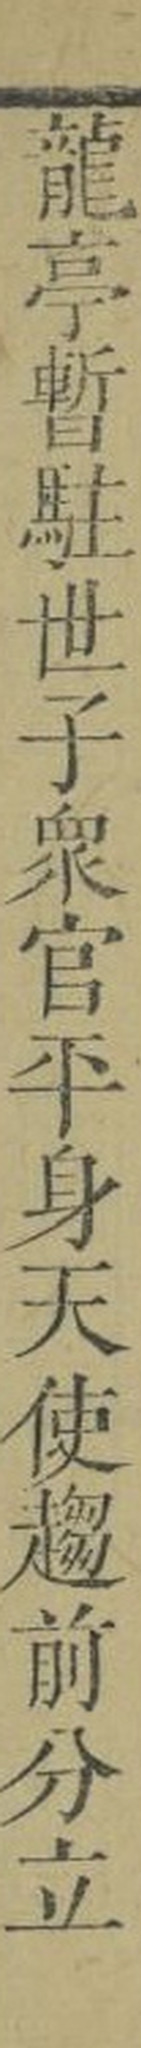龍亭暫駐世子衆官平身天使趨前分立
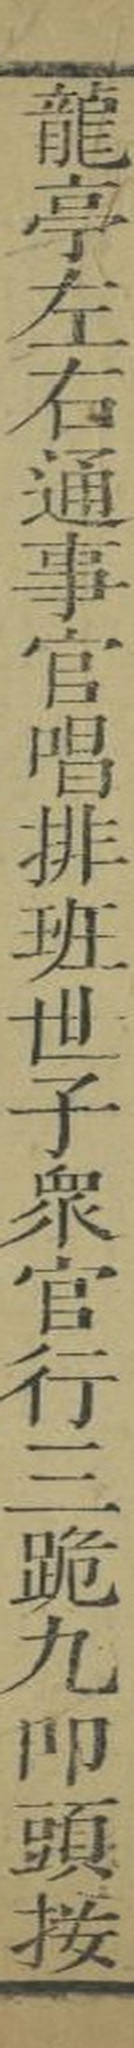龍亭左右通事官唱排班世子衆官行三跪九叩頭接
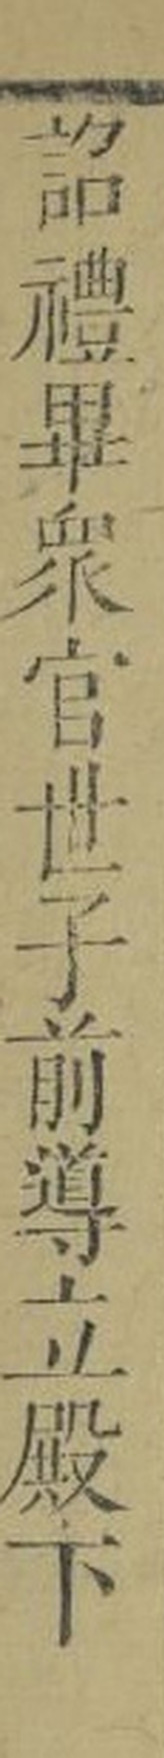詔禮畢衆官世子前導立殿下
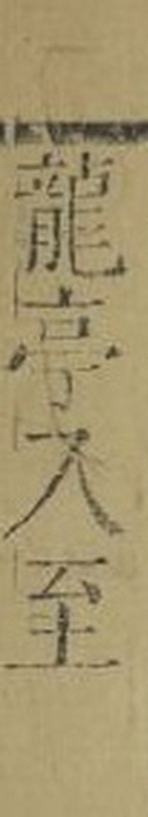龍亭入至

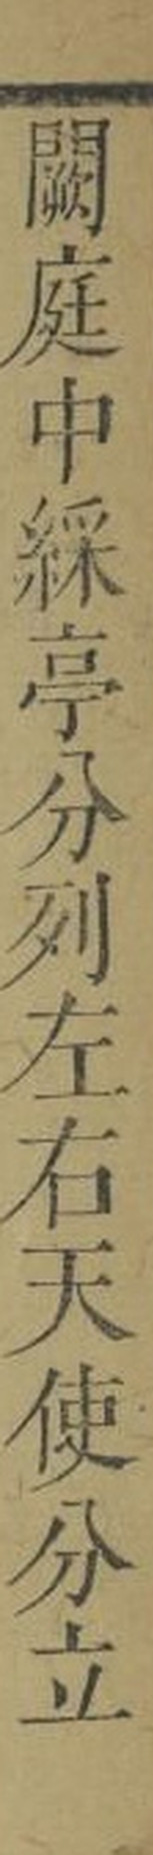闕庭中綵亭分列左右天使分立
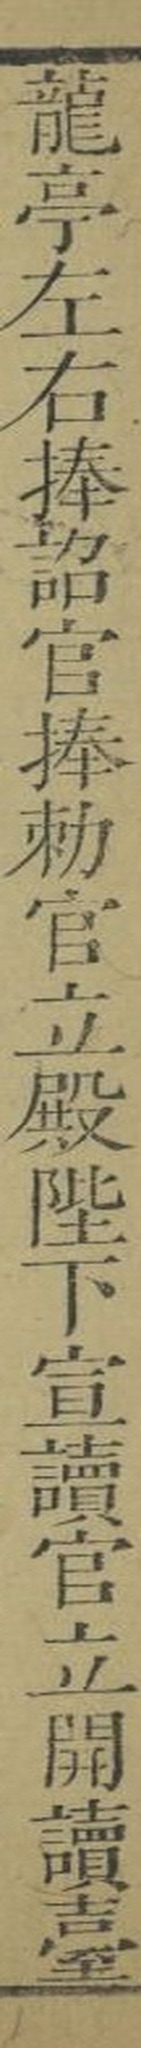龍亭左右捧詔官捧勅官立殿陛下宣讀官立開讀臺
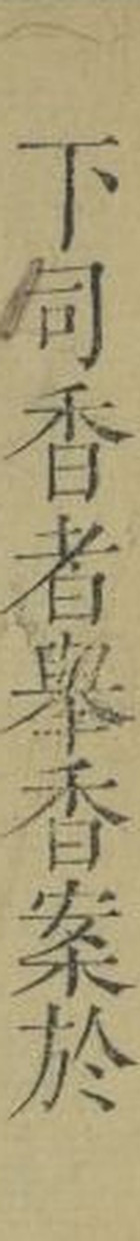下司香者舉香案於
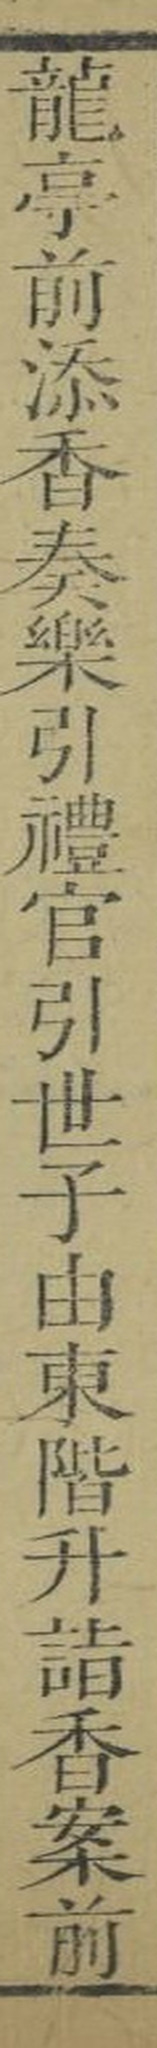龍亭前添香奏樂引禮官引世子由東階升詣香案前
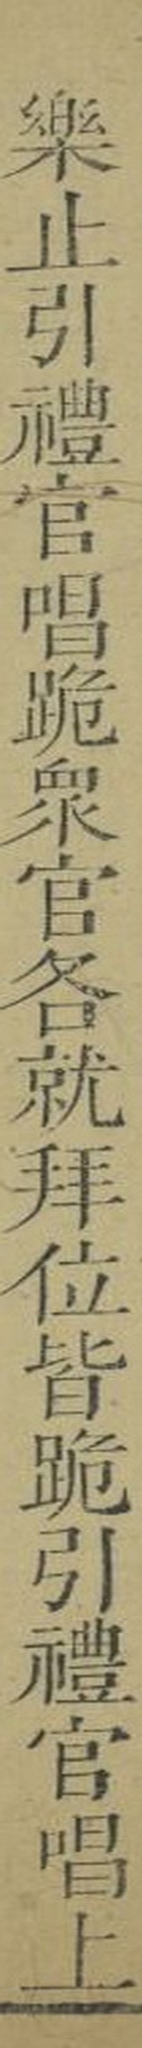樂止引禮官唱跪衆官各就拜位皆跪引禮官唱上
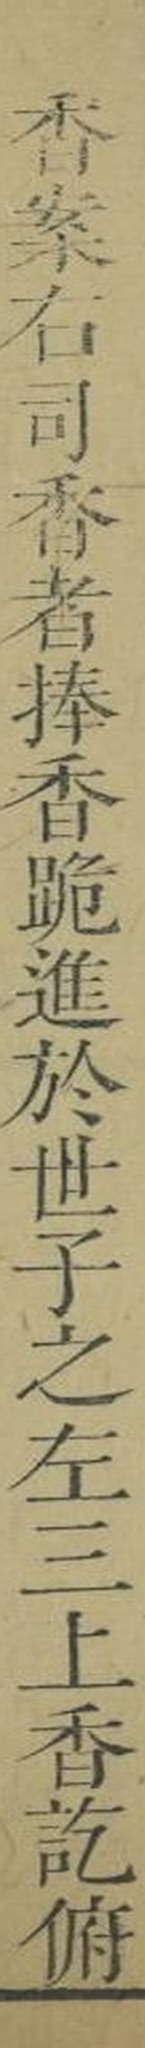香案右司香者捧香跪進於世子之左三上香訖俯
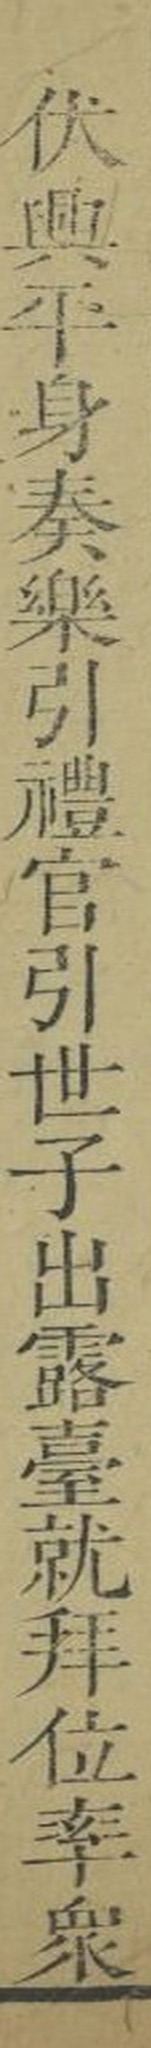伏興平身奏樂引禮官引世子出露臺就拜位率衆
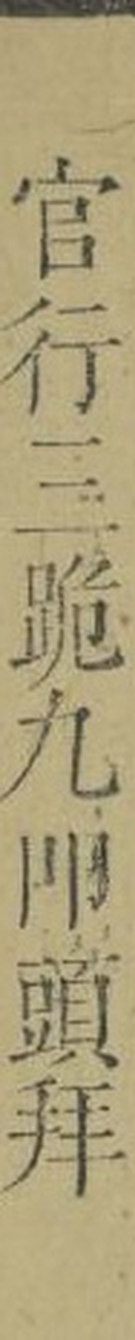官行三跪九叩頭拜
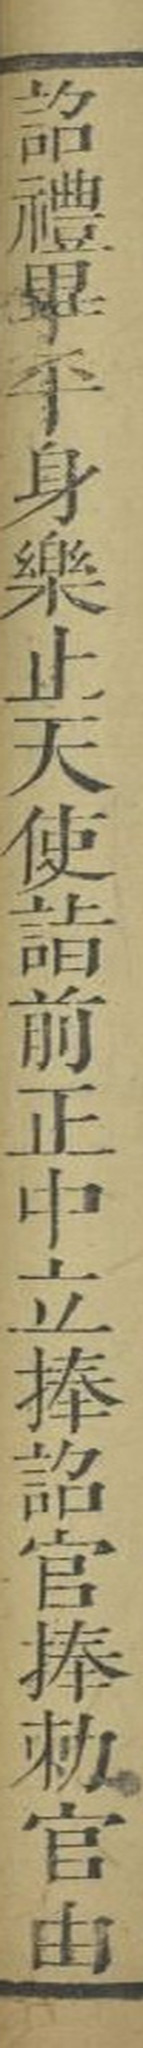詔禮畢平身樂止天使詣前正中立捧詔官捧勅官由
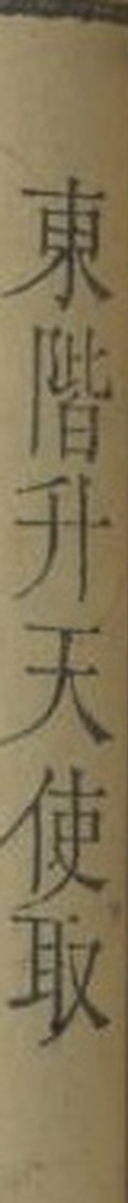東階升天使取
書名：中山伝信録 巻二
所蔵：University of the Ryukyus Library
